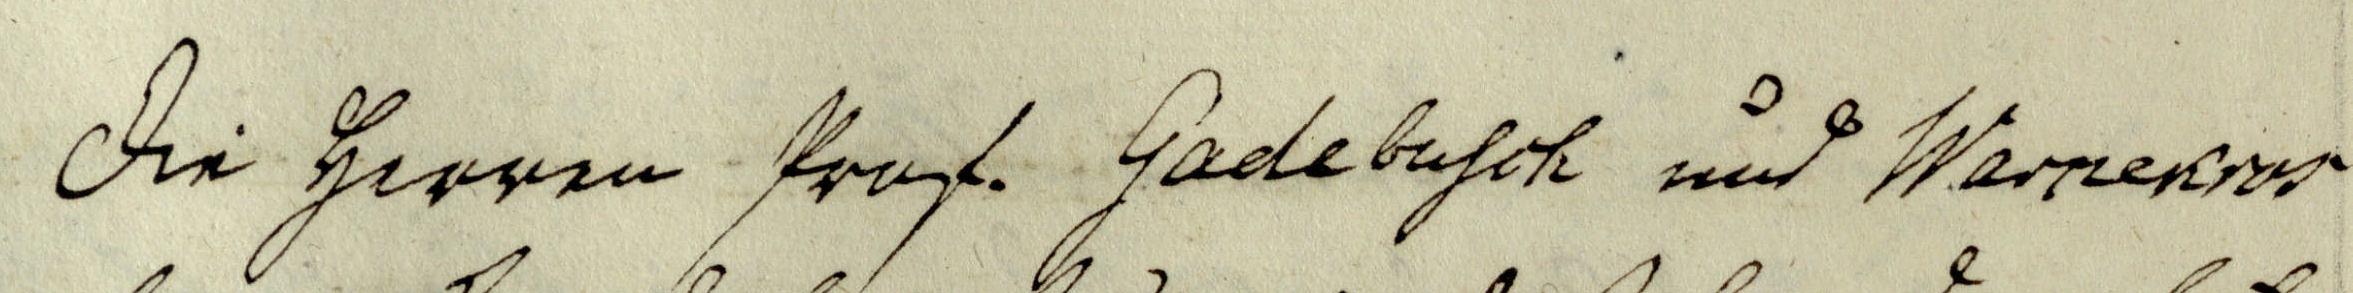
die Herren Prof. Gadebusch und Warnekros
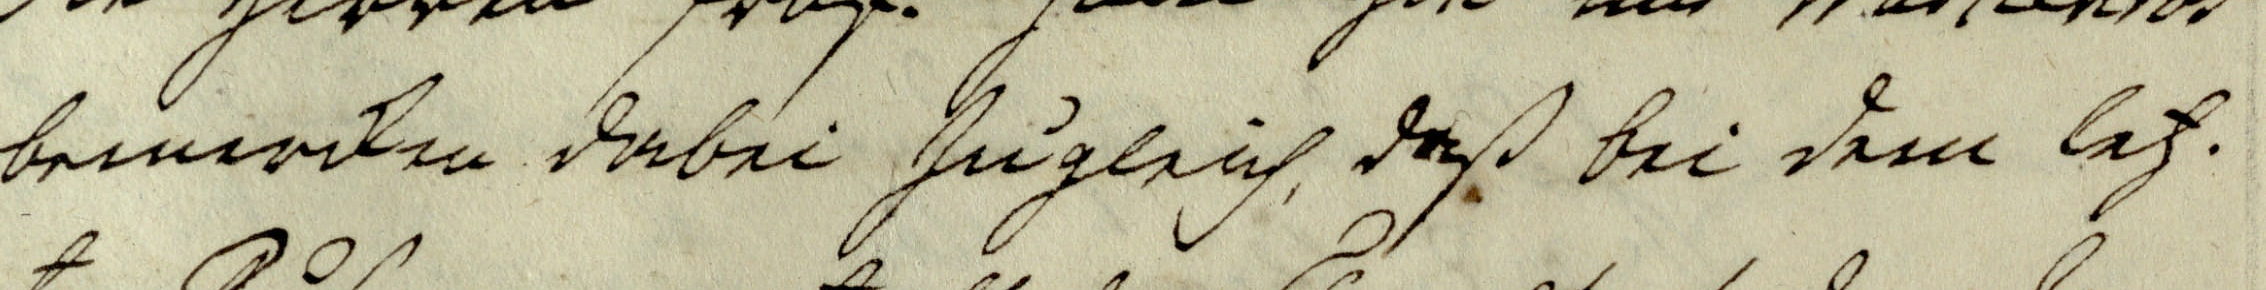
bemercken dabei zugleich, daß bei dem letz¬
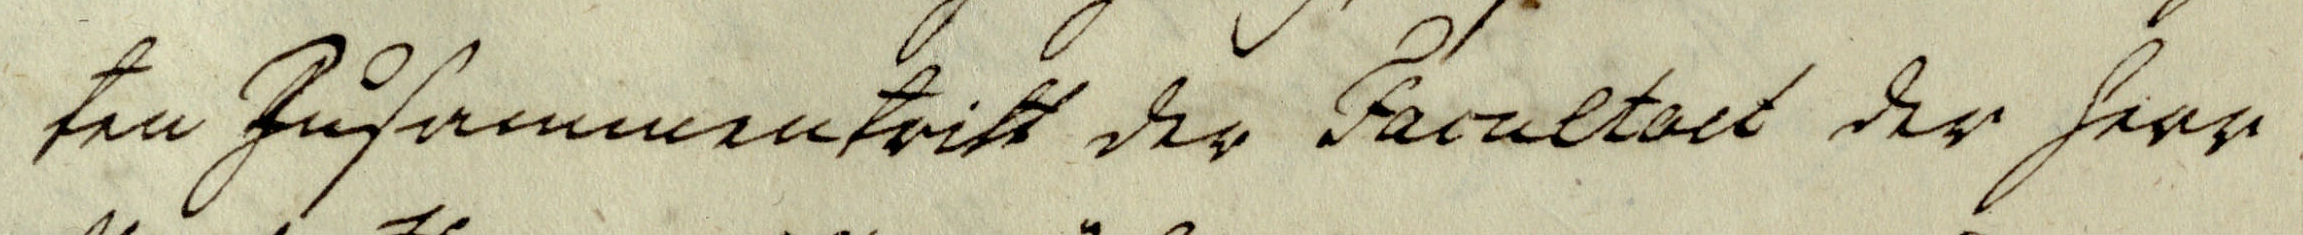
ten Zusammentritt der Facultaet der Herr
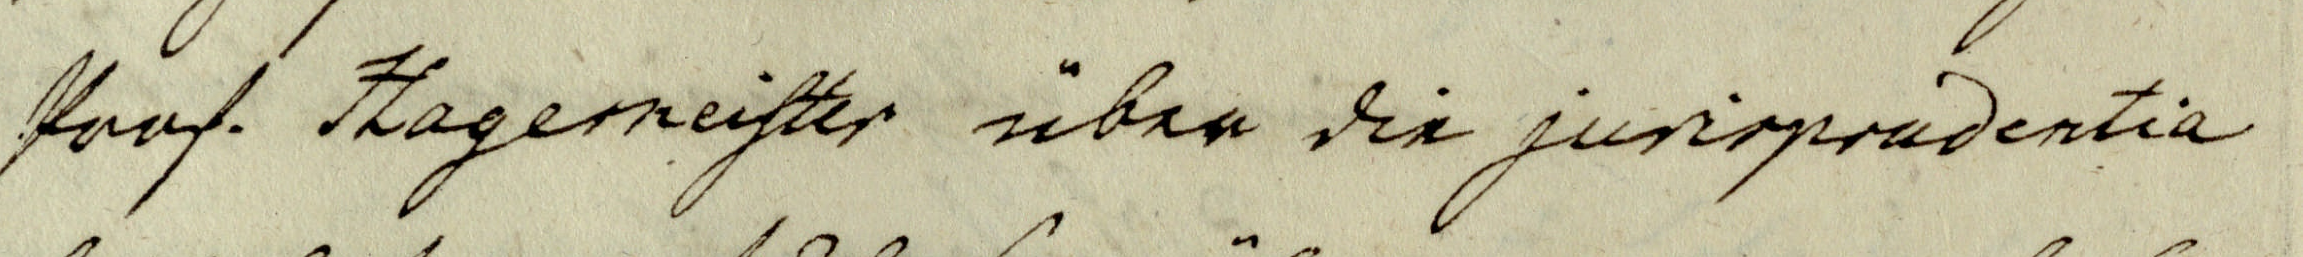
Prof. Hagemeister über die jurisprudentia
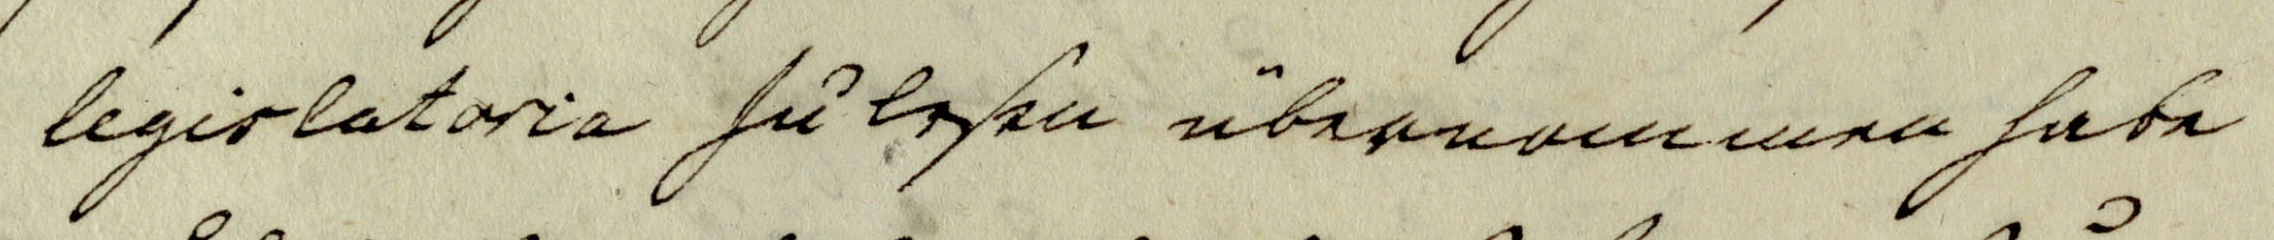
legislatoria zu lesen übernommen habe
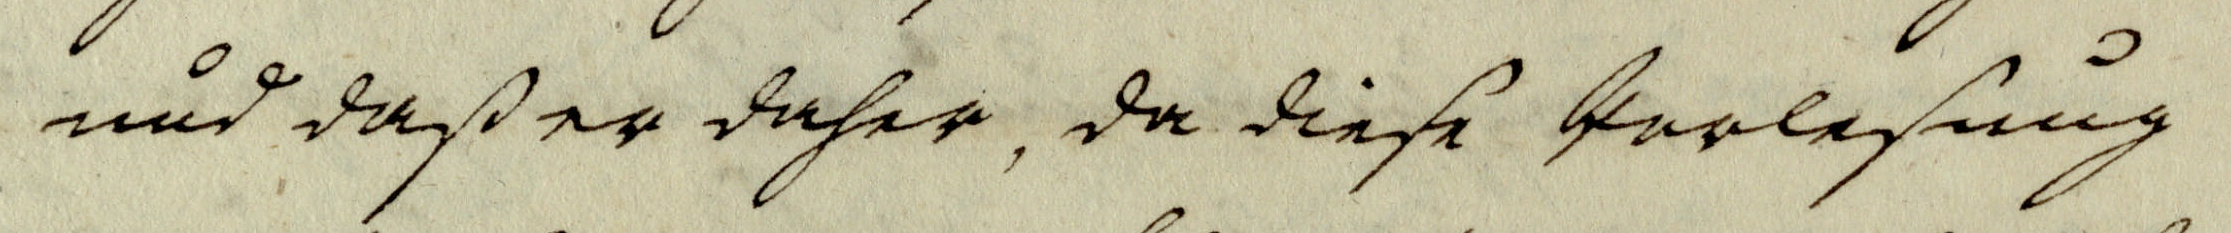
und daß er daher, da diese Vorlesung
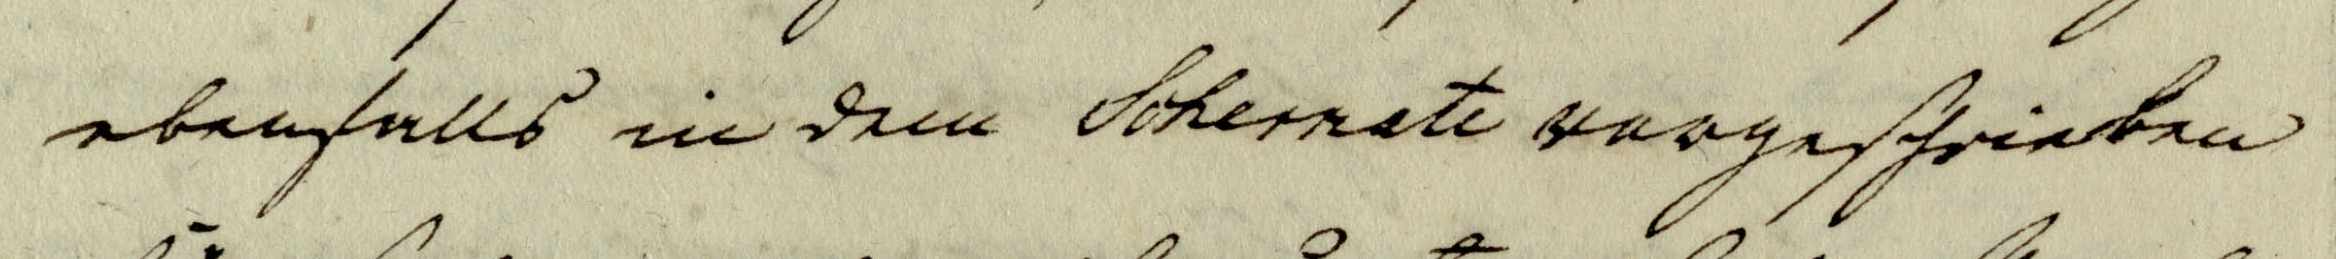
ebenfalls in dem Schemate vorgeschrieben
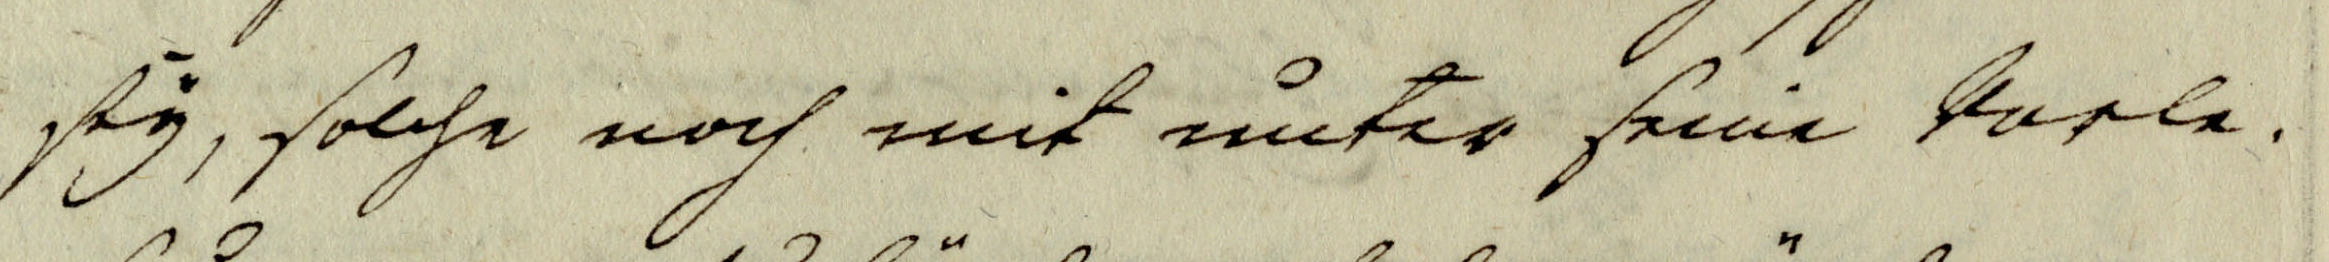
seÿ, solche noch mit unter seine Vorle¬
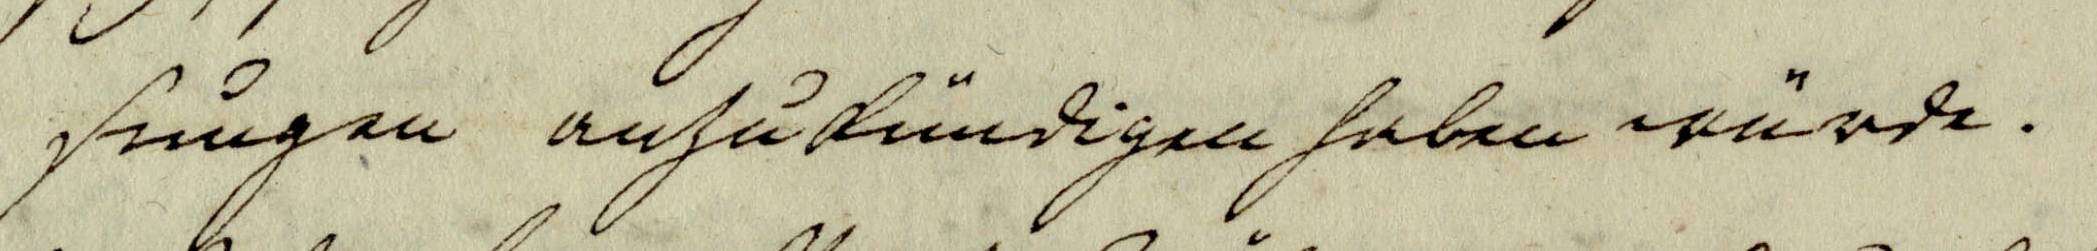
sungen anzukündigen haben würde.
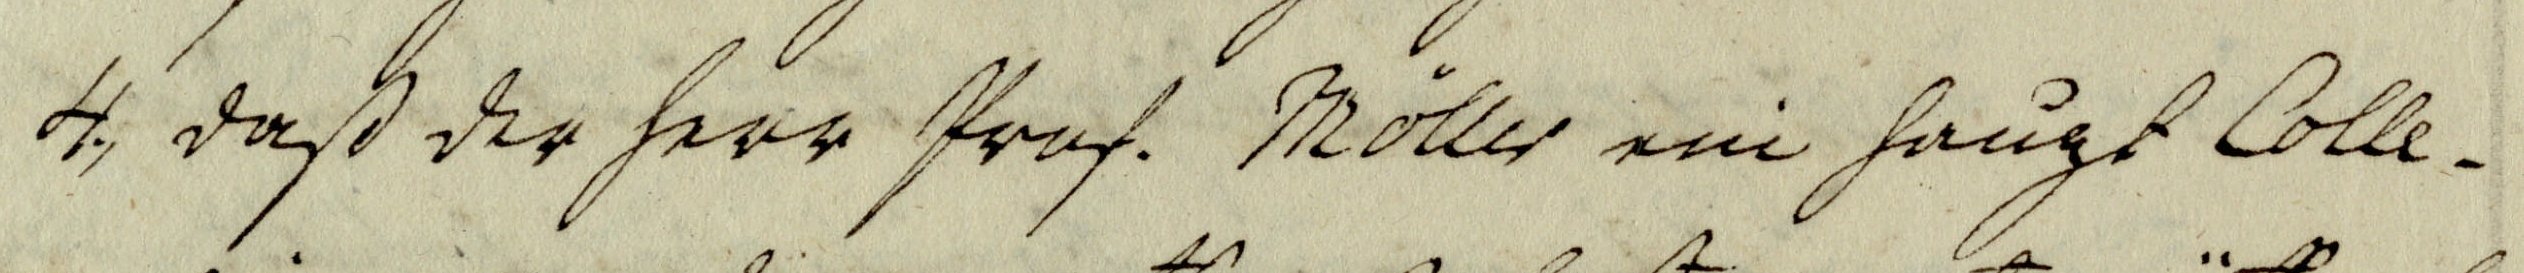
4., daß der Herr Prof. Möller ein Haupt Colle¬
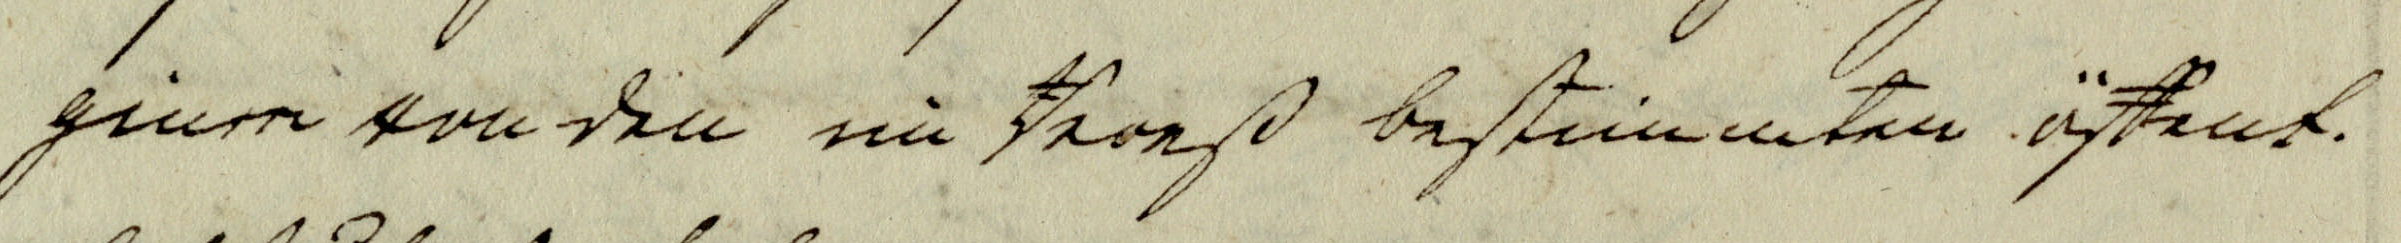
gium von den in Receß bestimmten öffent¬
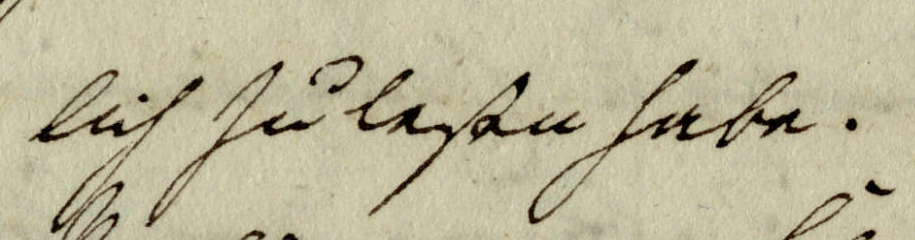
lich zu lesen habe.
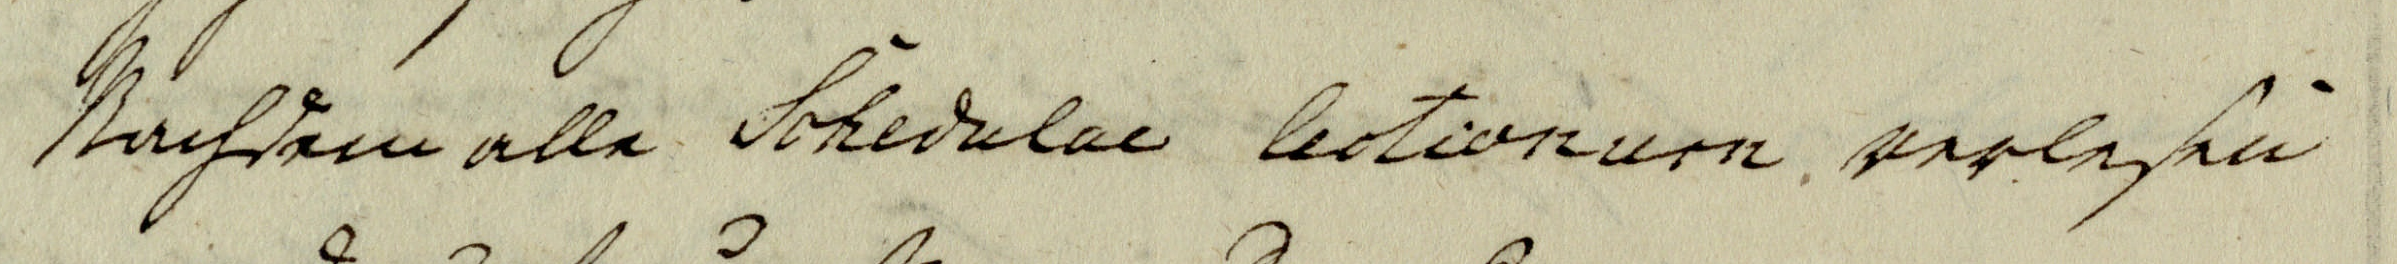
Nachdem alle Schedulae lectionum verlesen
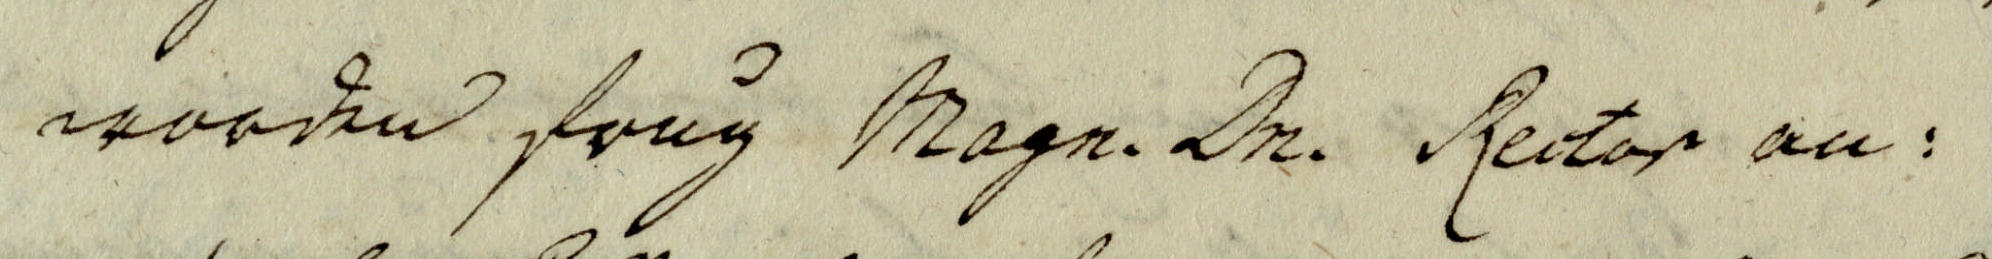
worden frug Magn. Dn. Rector an:
